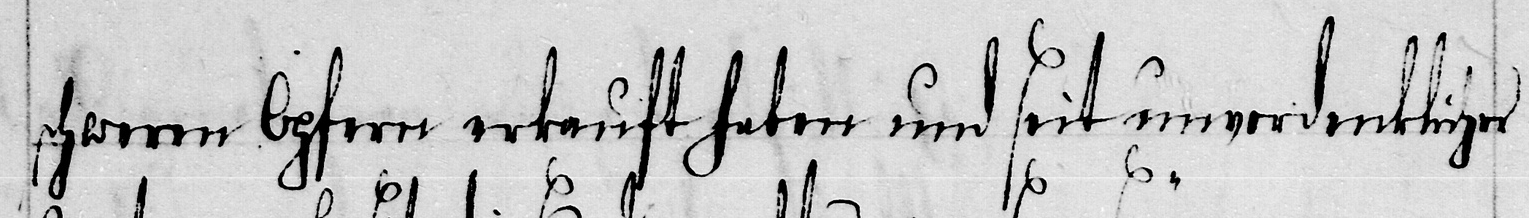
schweren Opfern erkauft haben und seit unverdenklich¬
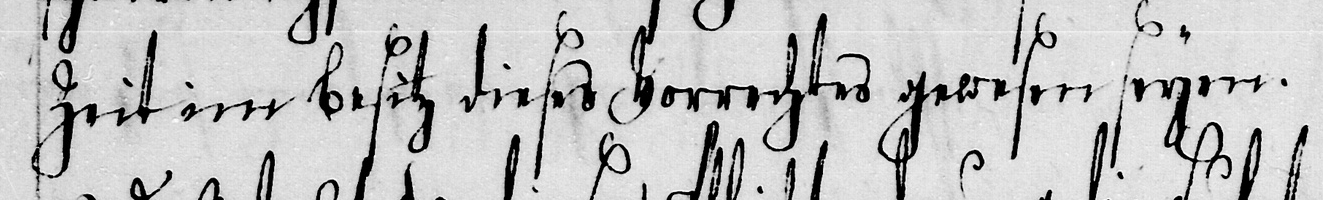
Zeit im Besitz dieses Vorrechtes gewesen seyen.
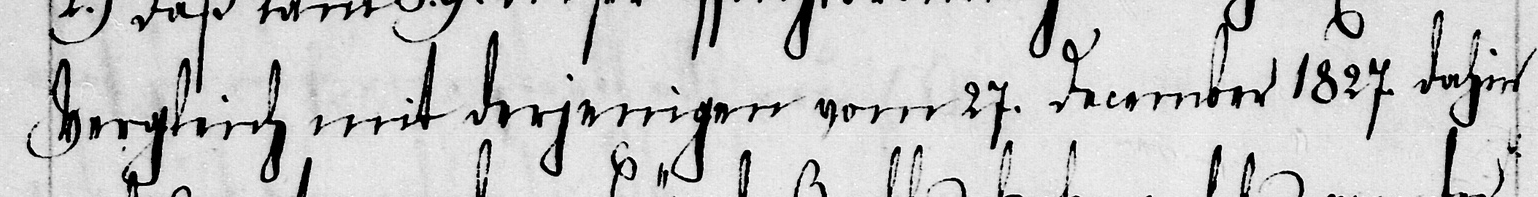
Vergleich mit derjenigen vom 27. December 1827. dahin
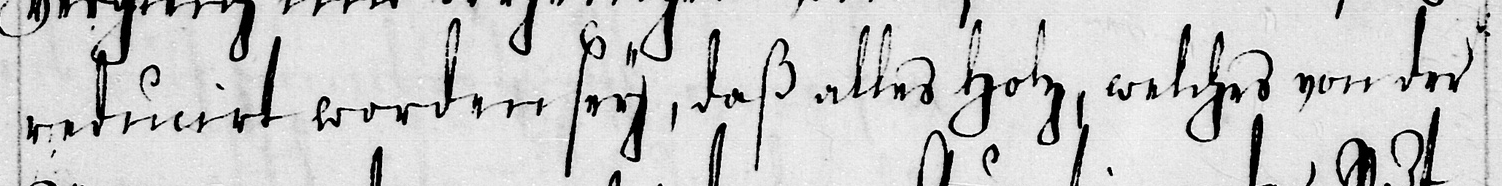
reducirt worden sey, daß alles Holz, welches von der
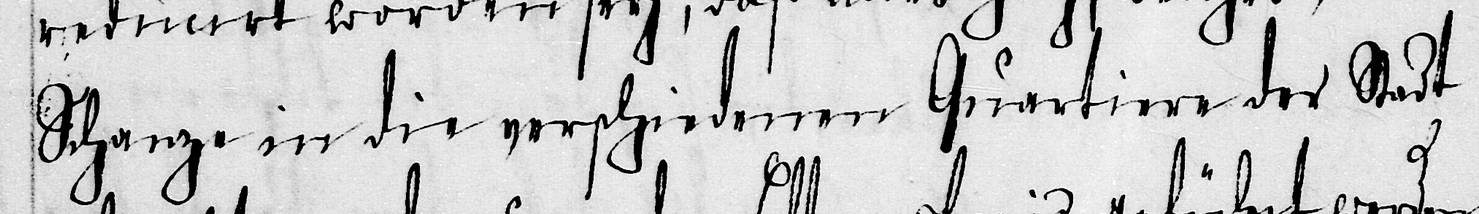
Schanze in die verschiedenen Quartiere der Stadt
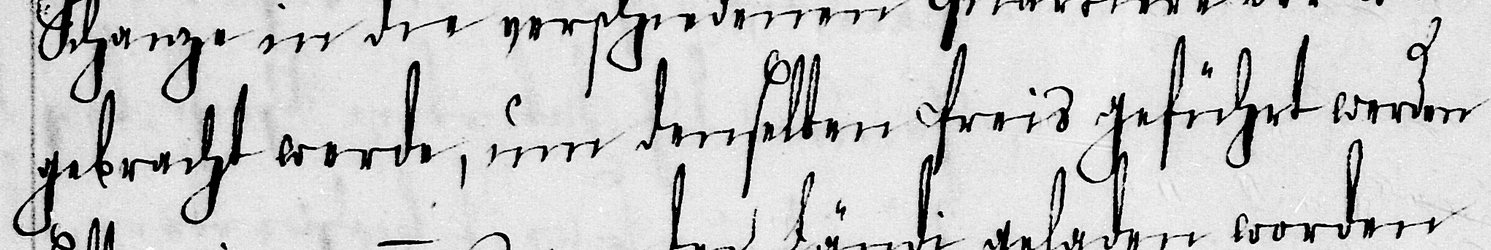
gebracht werde, um denselben Preis geführt werden
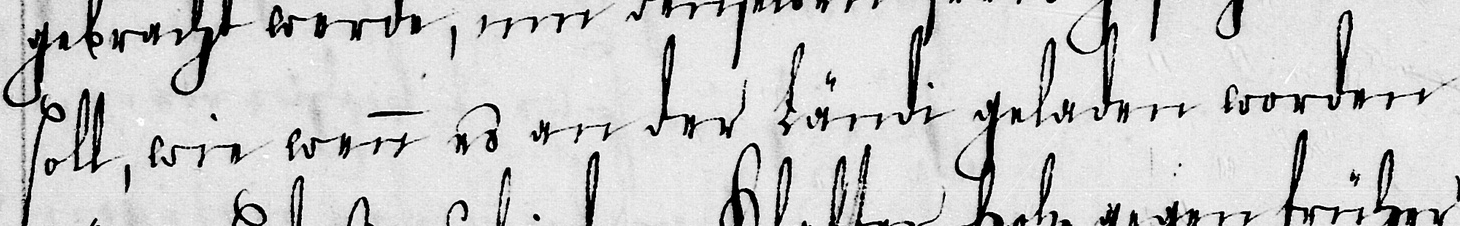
soll, wie wenn es an der Ländi geladen worden
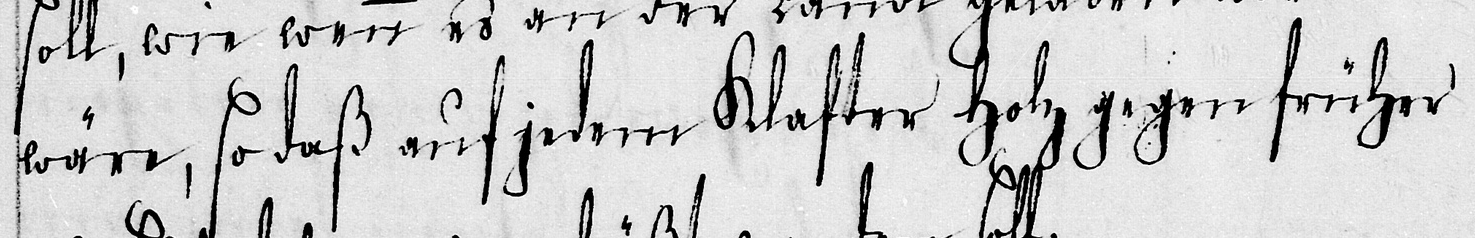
wäre, so daß auf jedem Klafter Holz gegen früher
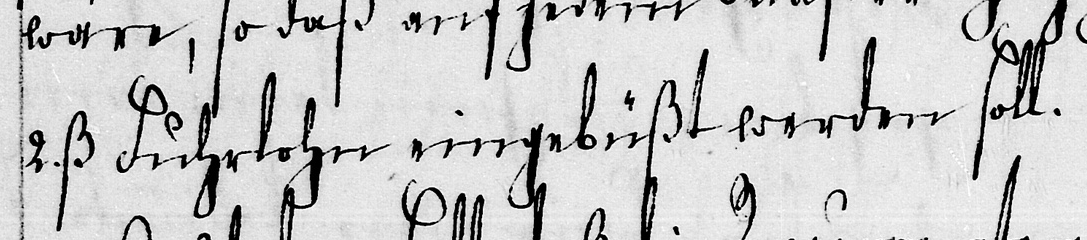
ß. Fuhrlohn eingebüßt werden sol¬
